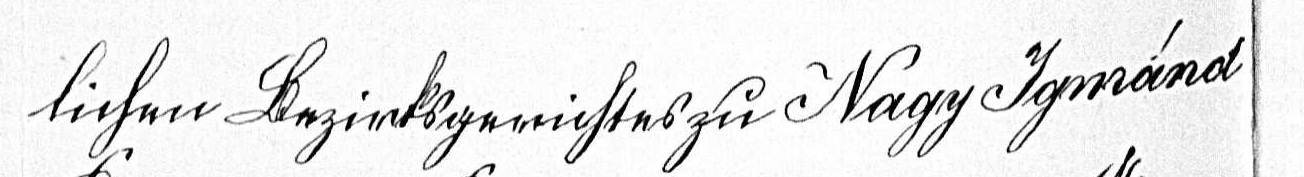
lichen Bezirksgerichtes Nagy Igmánd
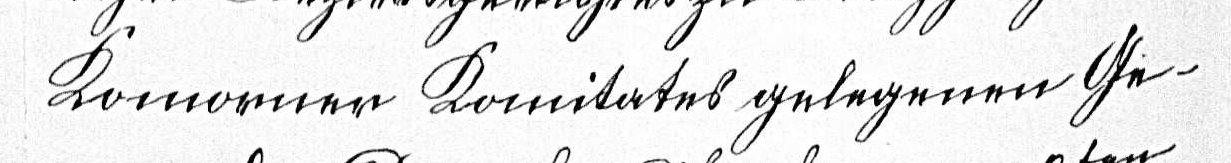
Komorner Komitates gelegenen Ge¬
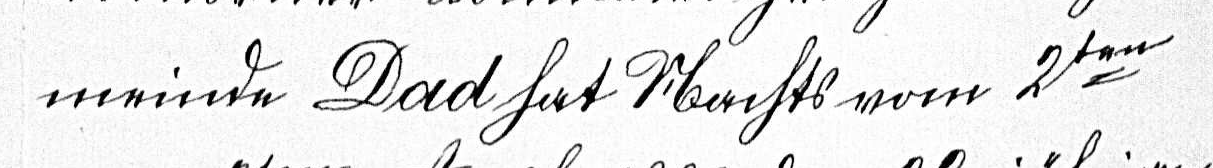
meinde Dad hat Nachts vom 2ten
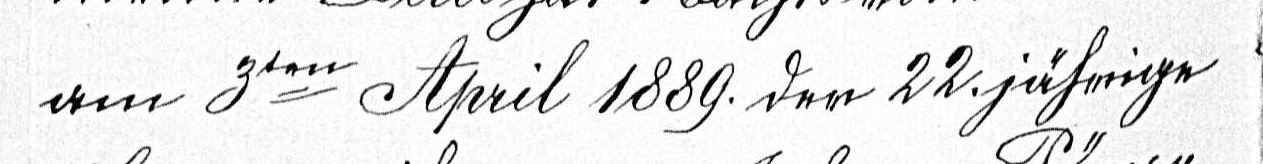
am 3ten April 1889 der 22 jährige
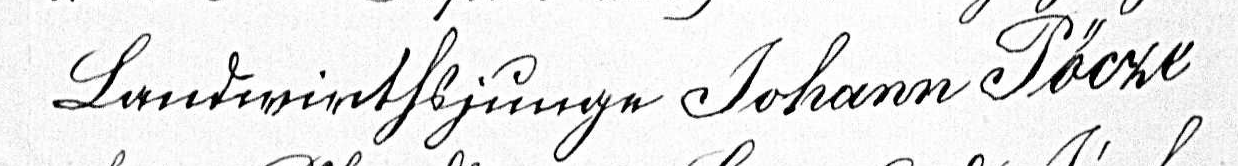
Landwirthsjunge Johann Pöcze
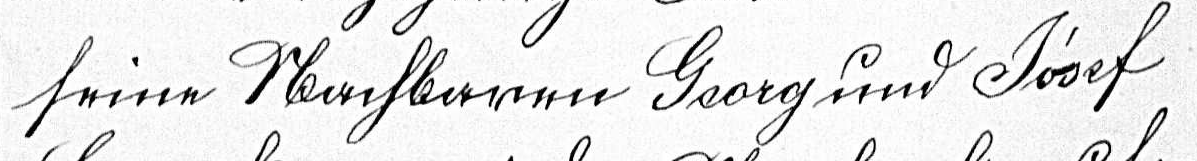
seine Nachbaren Georg und Jósef
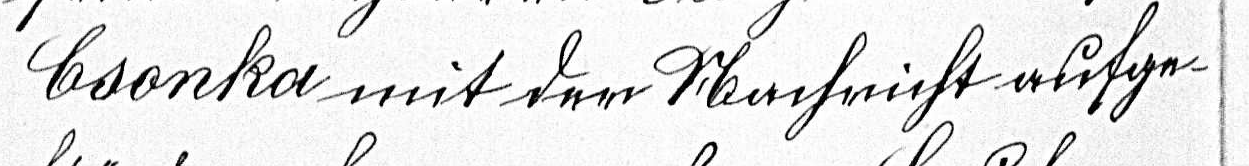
Csonka mit der Nachricht aufge¬
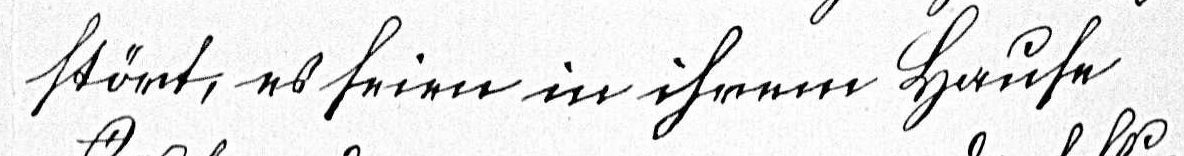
stört, es seien in ihrem Hause
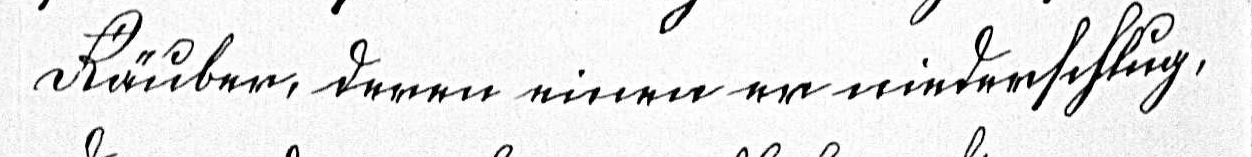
Räuber, deren einen er niederschlug,
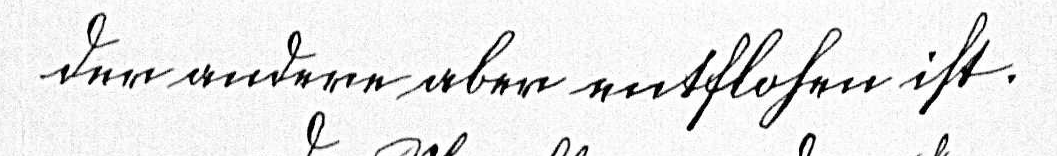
der andere aber entflohen ist.
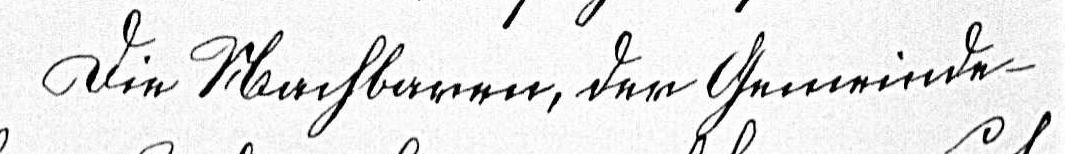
Die Nachbaren, der Gemeinde¬
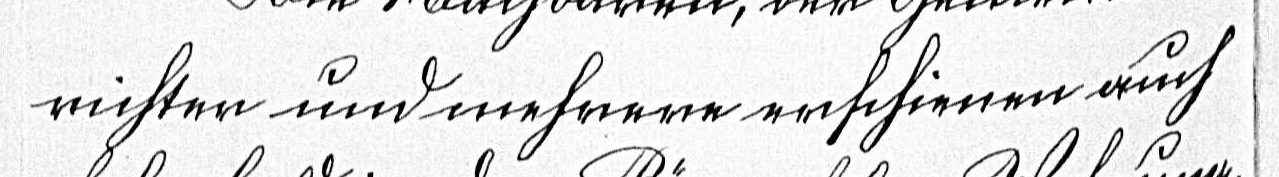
richter und mehrere erschienen auch
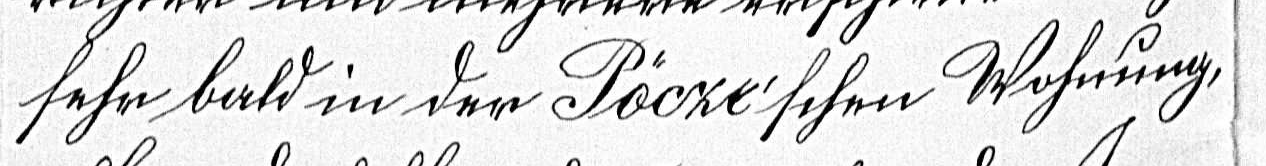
sehr bald in der Pöcze’schen Wohnung,
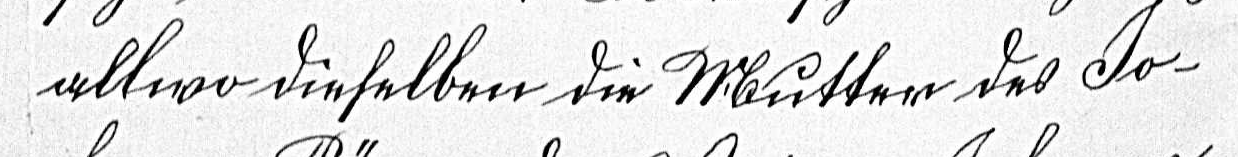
allwo-dieselben die Mutter des Jo¬
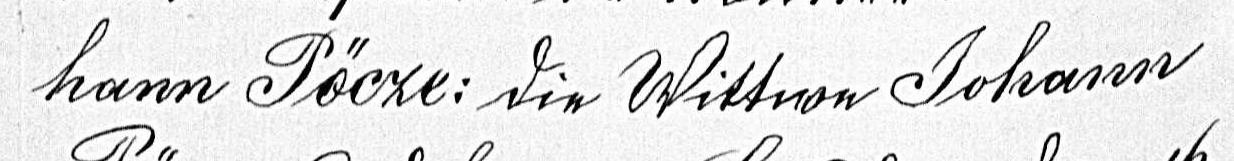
hann Pöcze: die Wittwe Johann
